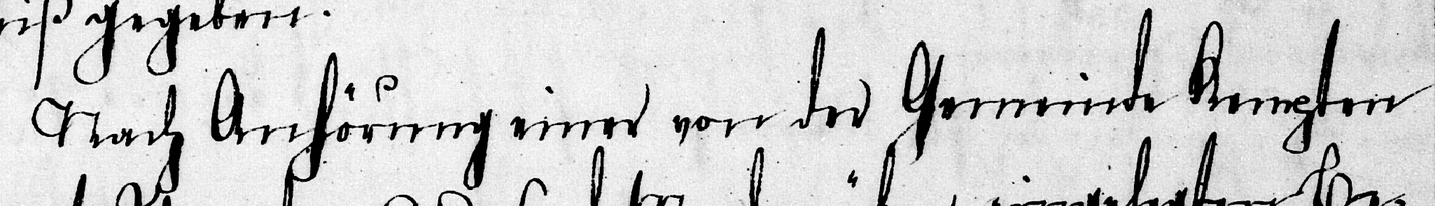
Nach Anhörung einer von der Gemeinde Kempten
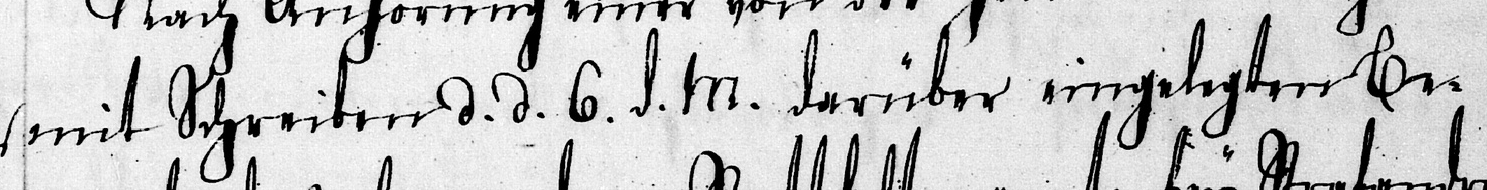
mit Schreiben d. d. 6. d. M. darüber eingelegten Bes¬
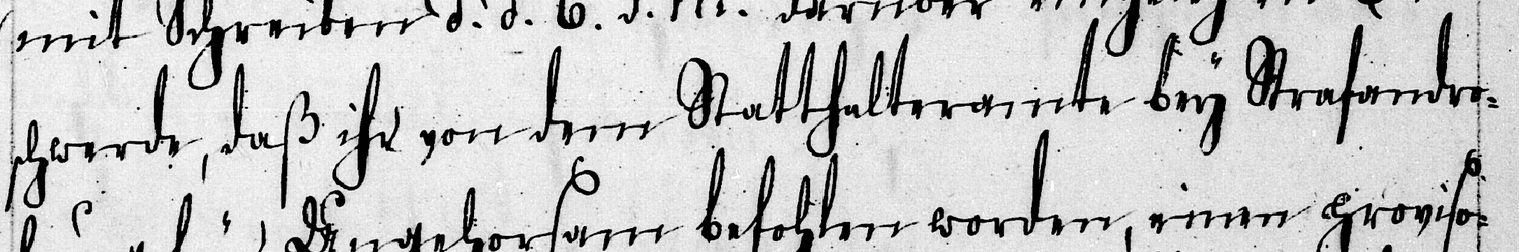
chwerde, daß ihr von dem Statthalteramte bey Strafandro¬
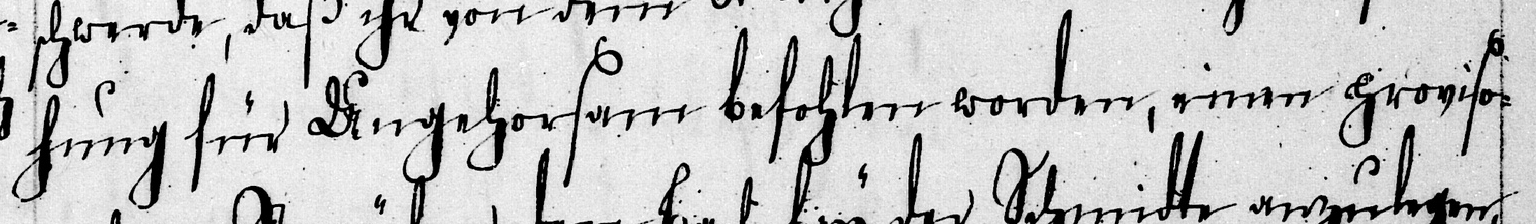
hung für Ungehorsam befohlen worden, einen proviso¬
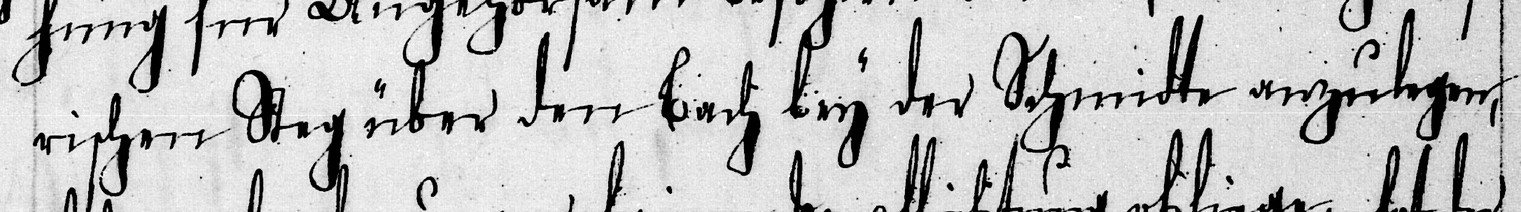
rischen Steg über den Bach bey der Schmidte anzulegen,
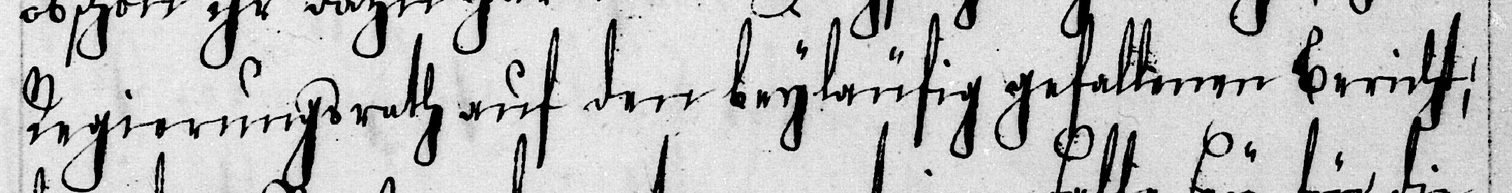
Regierungsrath auf den beyläufig gefallenen Bericht,
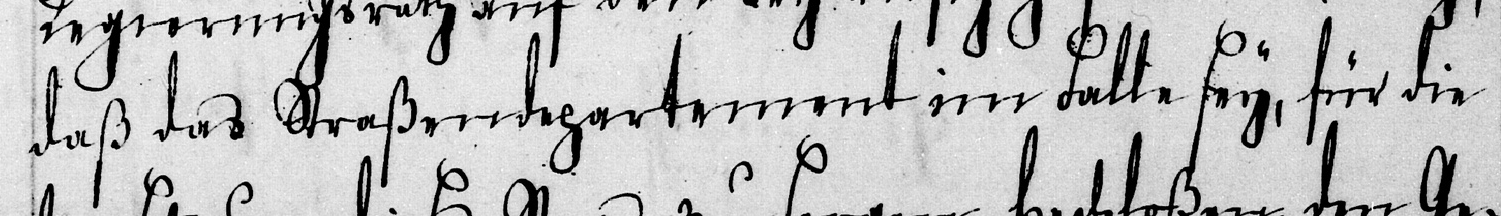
daß das Straßendepartement im Falle sey, für die
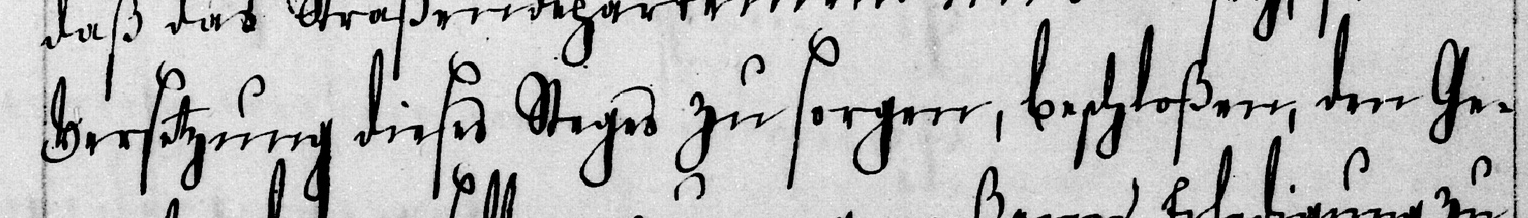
Versetzung dieses Steges zu sorgen, beschloßen, den Ge¬
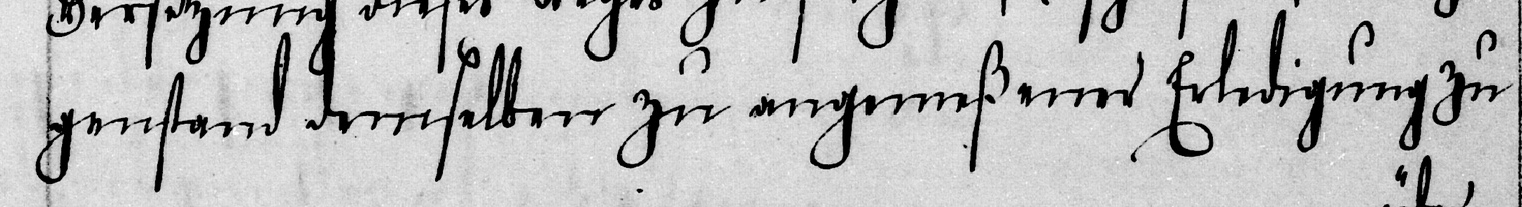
genstand demselben zu angemeßener Erledigung zu
